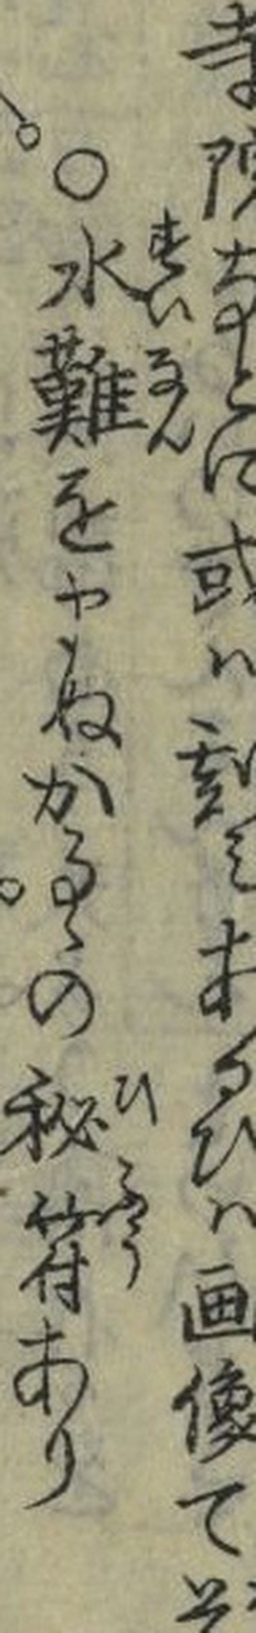〇水難をまぬかるゝの秘符あり
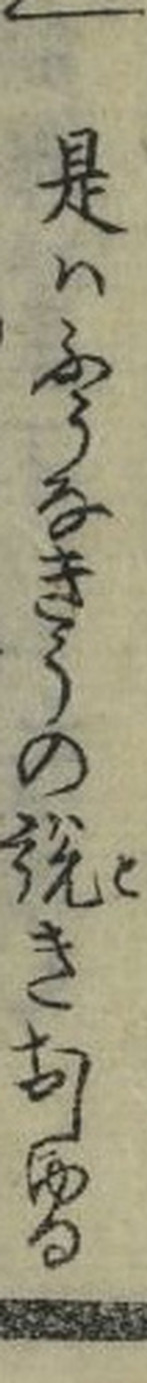是ハふうなきうの説きおしゆる
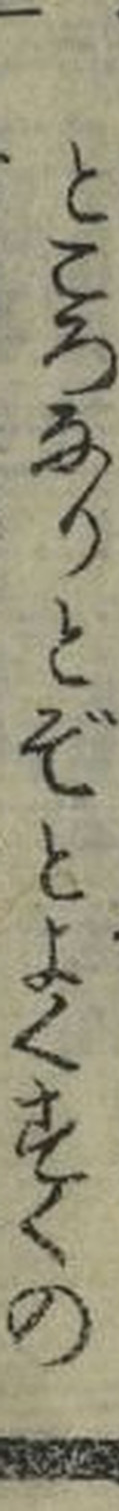ところなりとぞとよくすくの
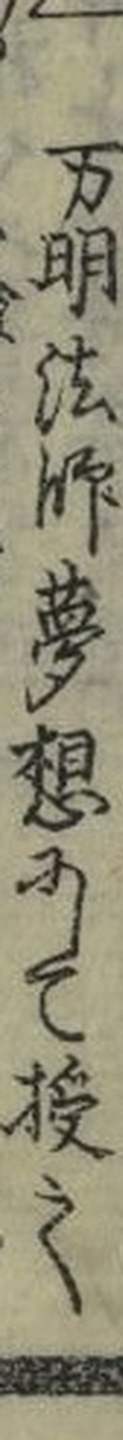万明法師夢想にして授也
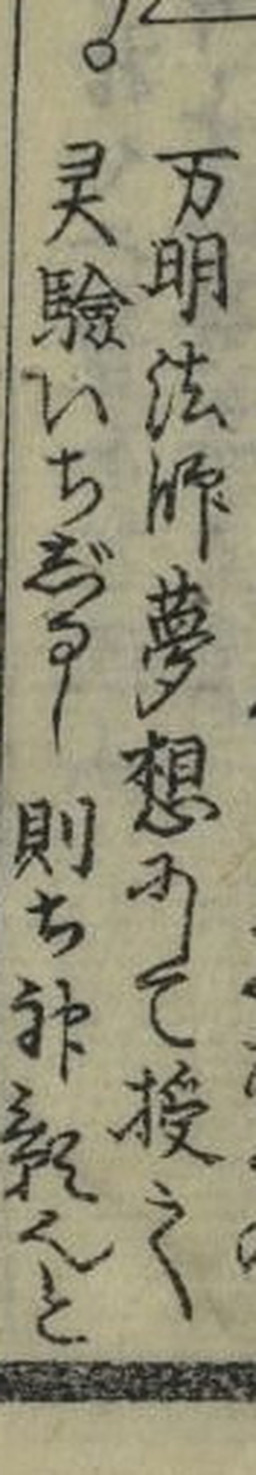霊驗いちじるし則ち神影也と

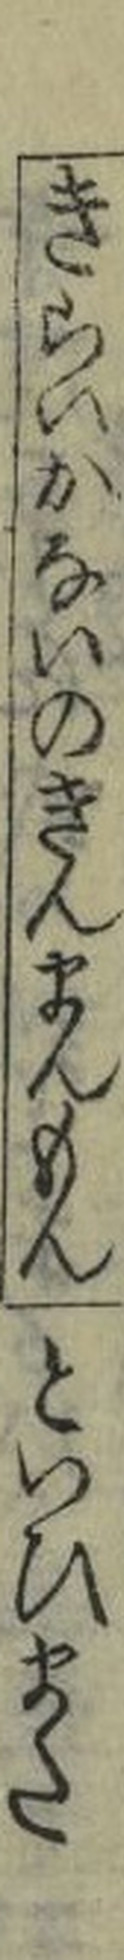[きらいかないのきんまんもん]といひまた
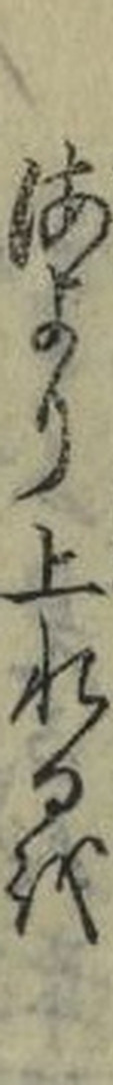海より上れるを
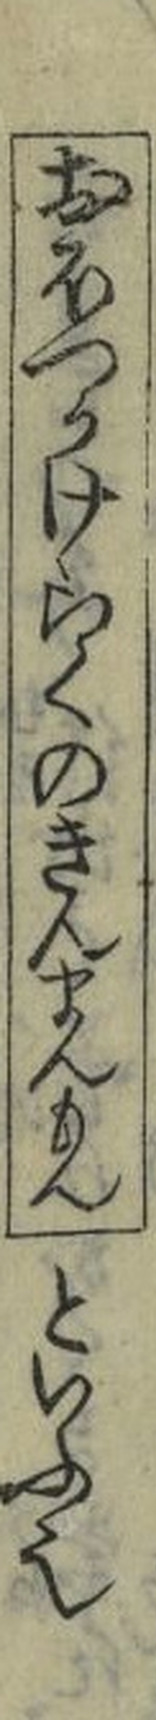[おほつうけらくのきんまんもん]といふ也
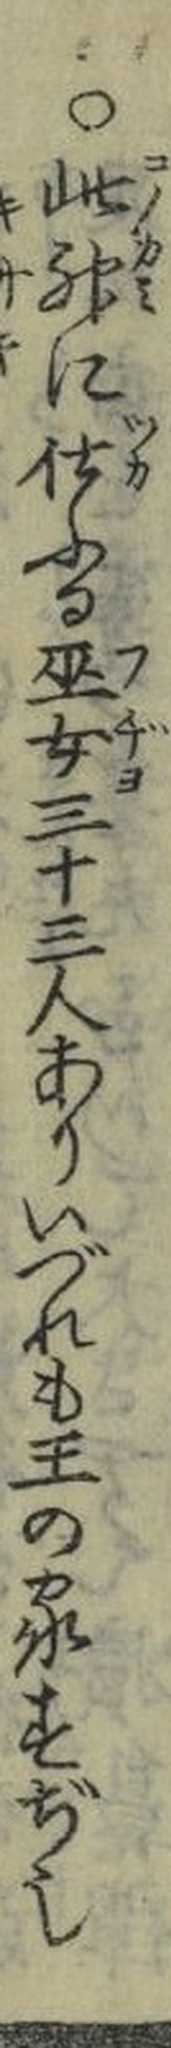〇此神に仕ふる巫女三十三人ありいづれも王の家すぢ也
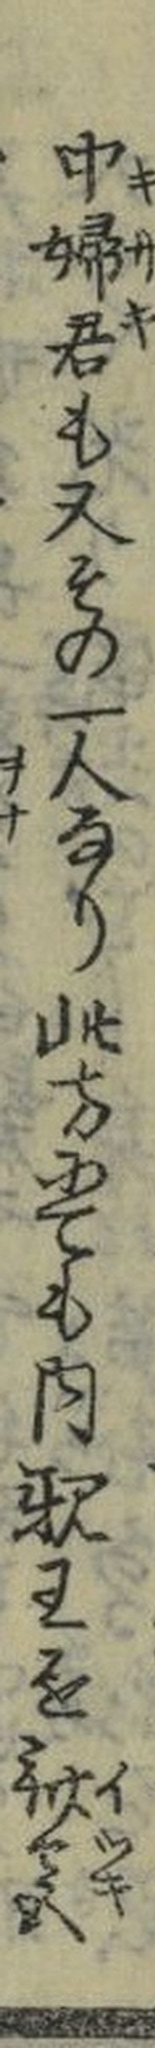中婦君も又その一人なり此方にても内親王を斎宮
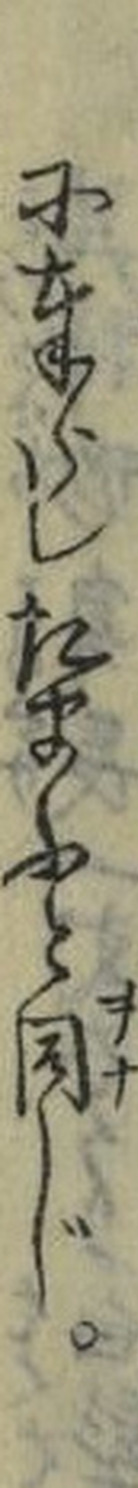に奉らしたまふと同じ。
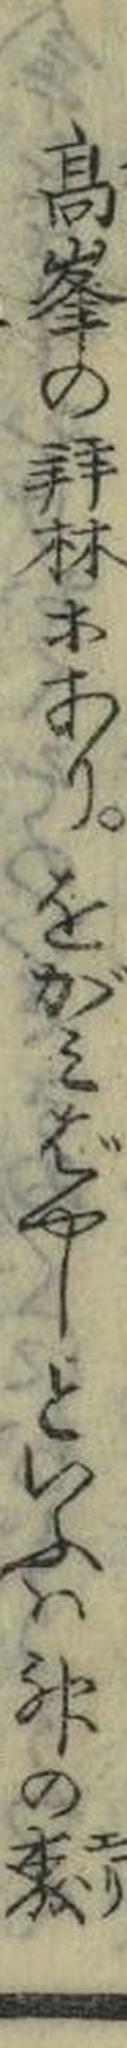高峯の拝林あり。をがミばやしといふハ神の森
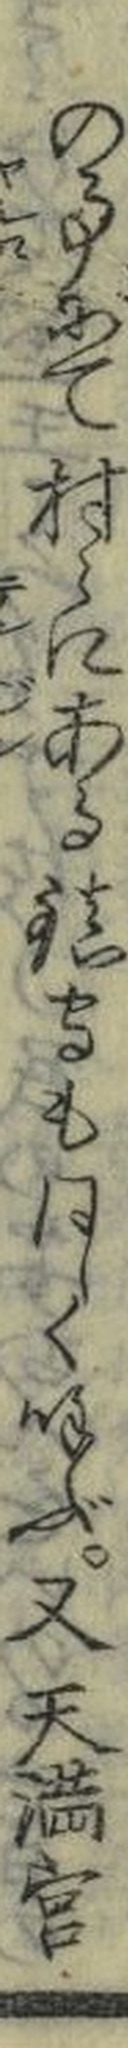の事にて村々にある鎮守も同しく呼ぶ。又天満宮
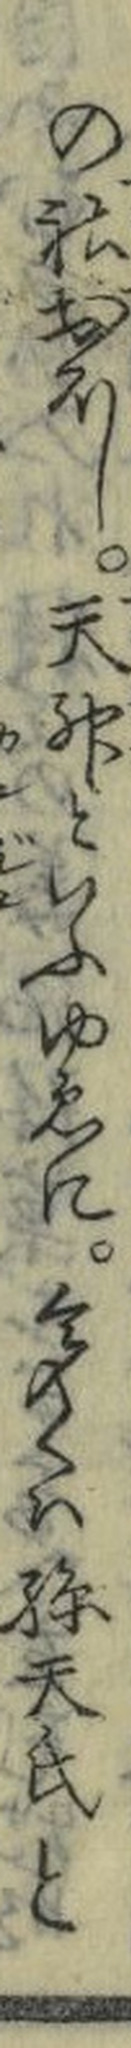の社おほし。天神といふゆゑに。多くハ孫天氏と
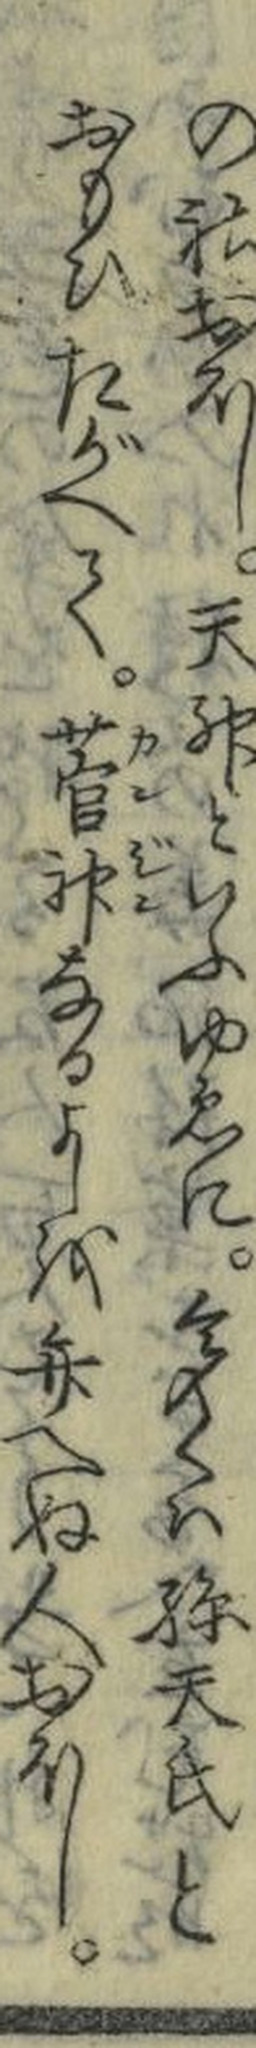おもひたがへて。菅神なるよしを弁へぬ人おほし。
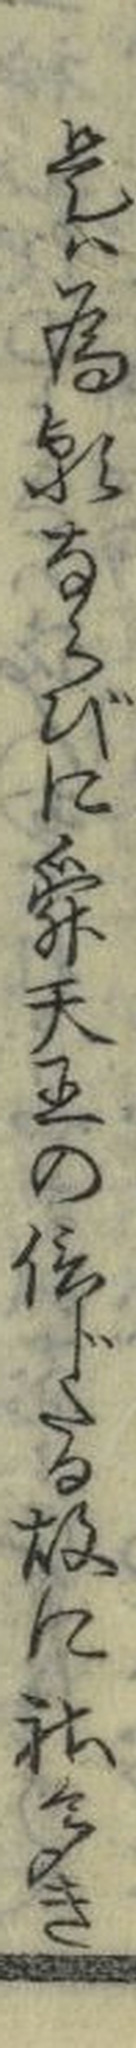是ハ為朝ならびに舜天王の信じたる故に社多き
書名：琉球奇譚
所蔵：University of the Ryukyus Library
